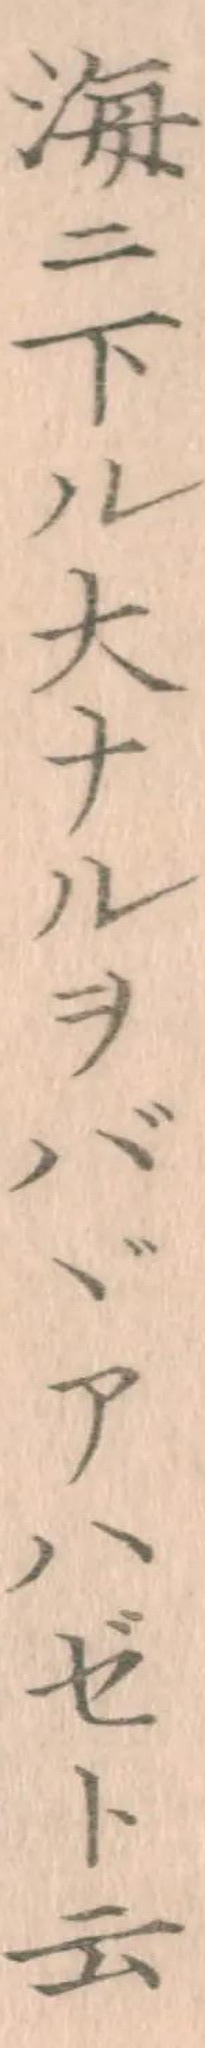海ニ下ル大ナルヲバヾアハゼト云
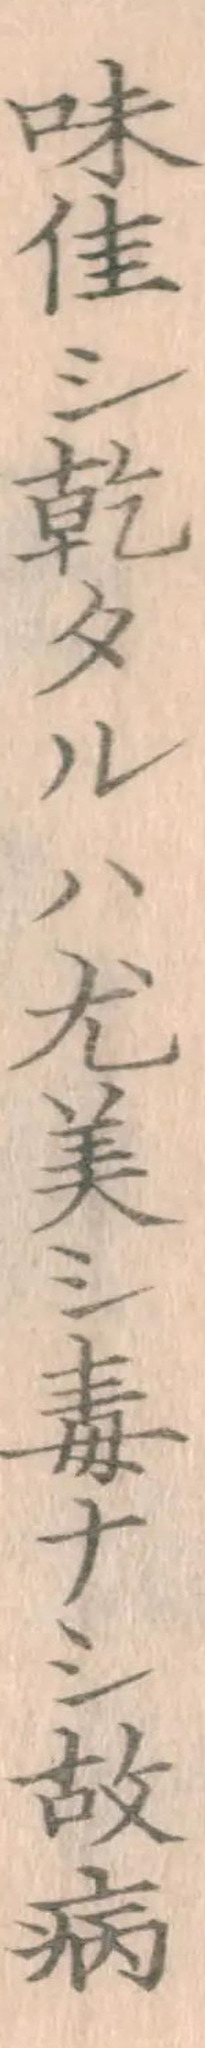味佳シ乾タルハ尤美シ毒ナシ故病
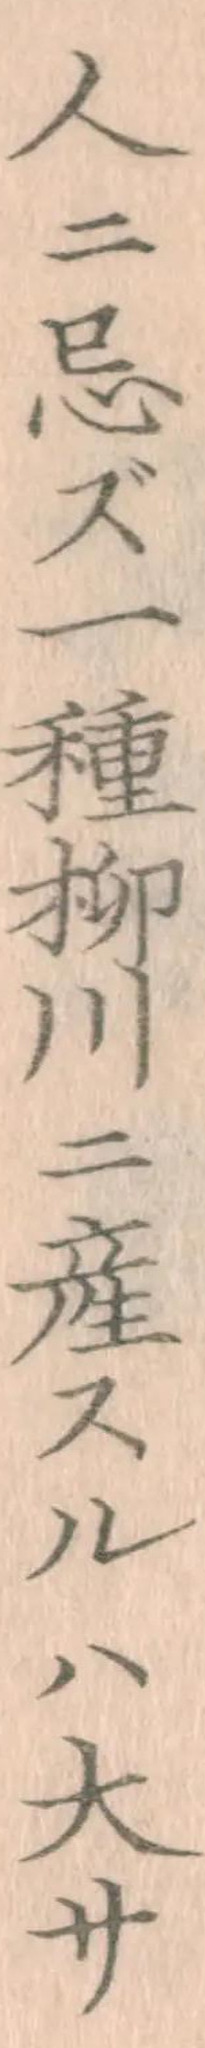人ニ忌ズ一種柳川ニ産スルハ大サ
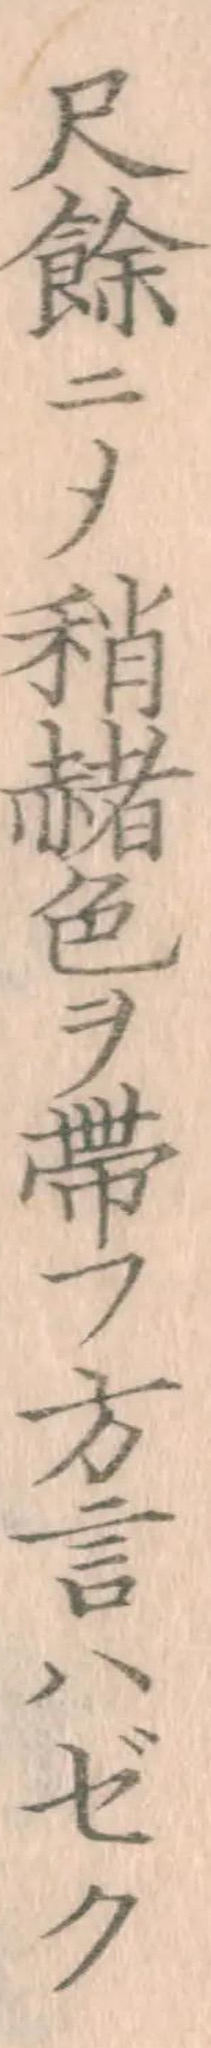尺余ニシテ稍赭色ヲ帯フ方言ハゼク
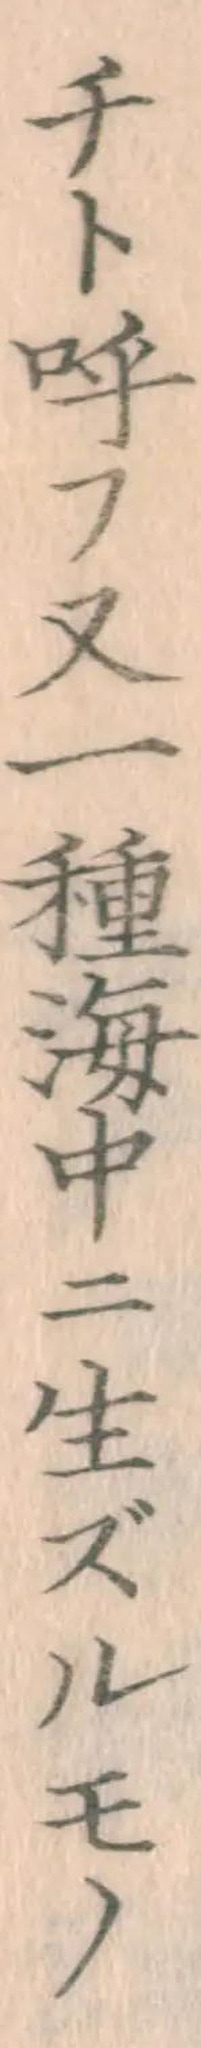チト呼フ又一種海中ニ生ズルモノ
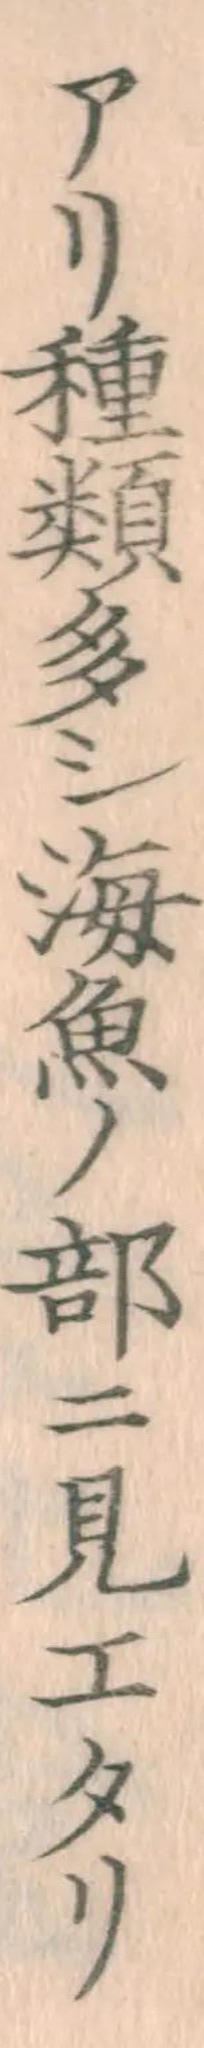アリ種類多シ海魚ノ部ニ見エタリ

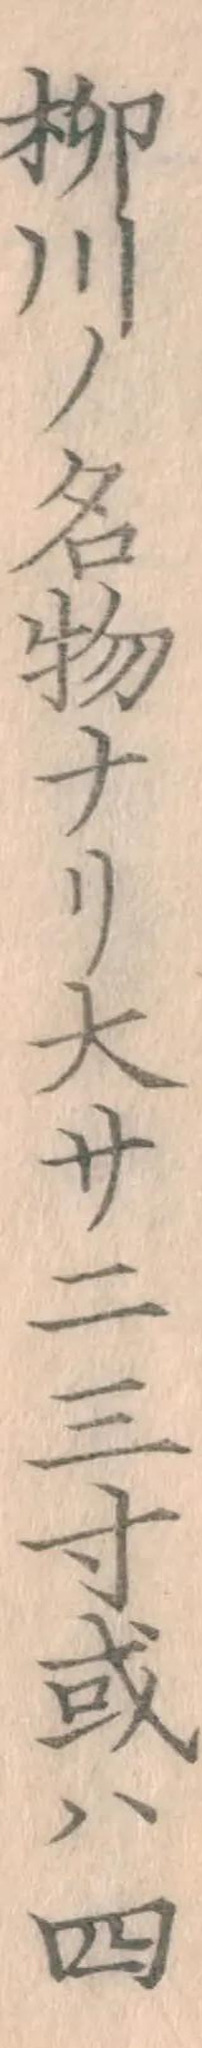柳川ノ名物ナリ大サ二三寸或ハ四
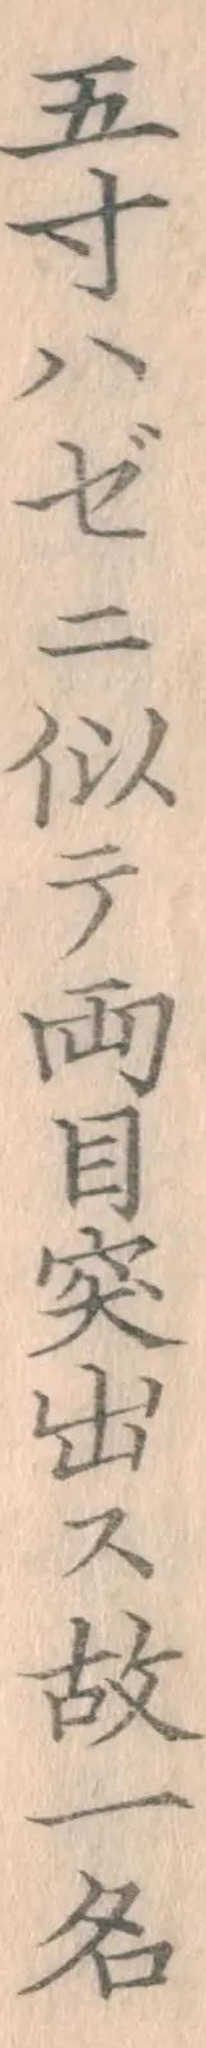五寸ハゼニ似テ両目突出ス故一名
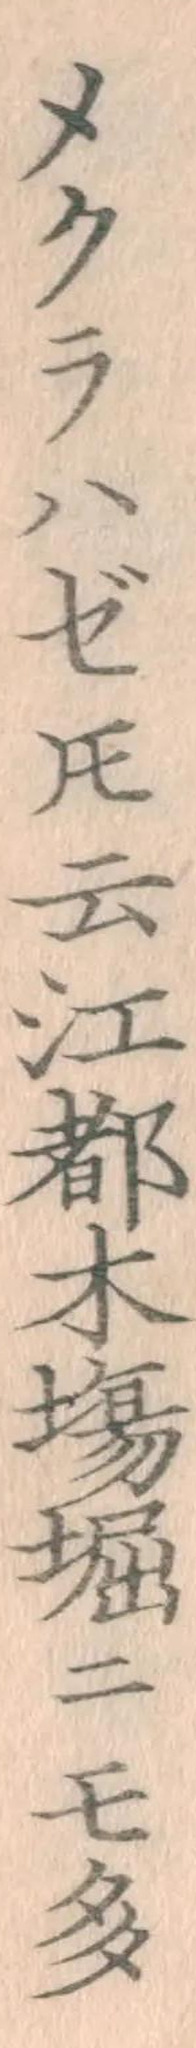メクラハゼトモ云江都木場堀ニモ多
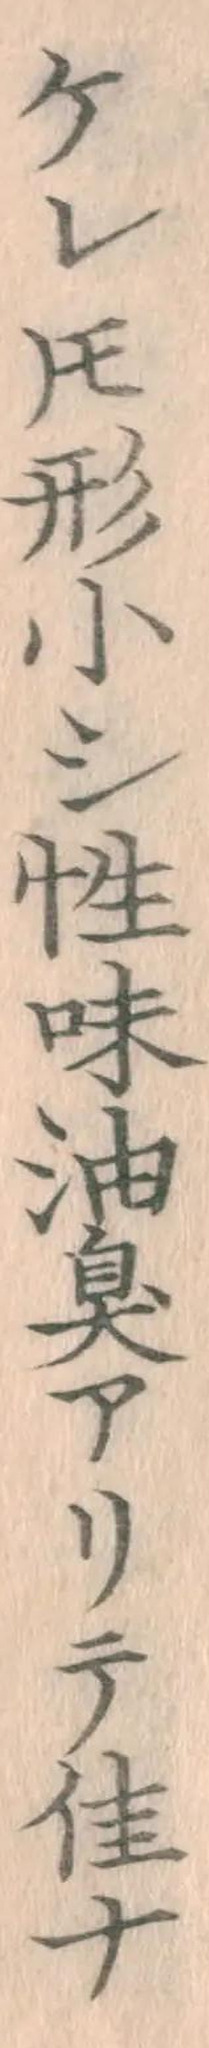ケレトモ形小シ性味油臭アリテ佳ナ
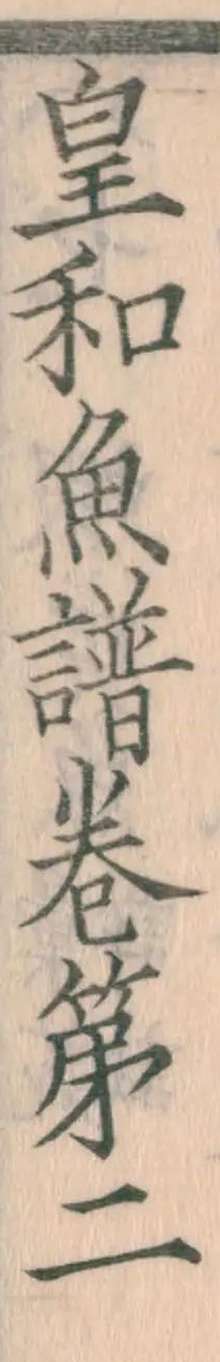皇和魚譜巻第二
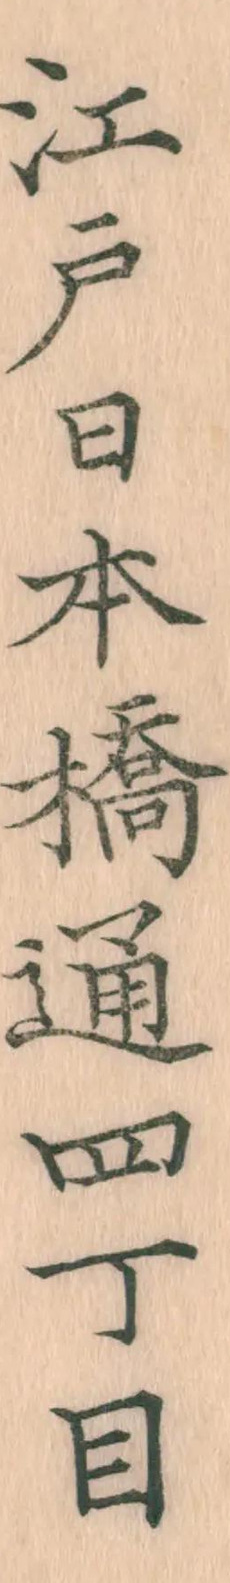江戸日本橋通四丁目
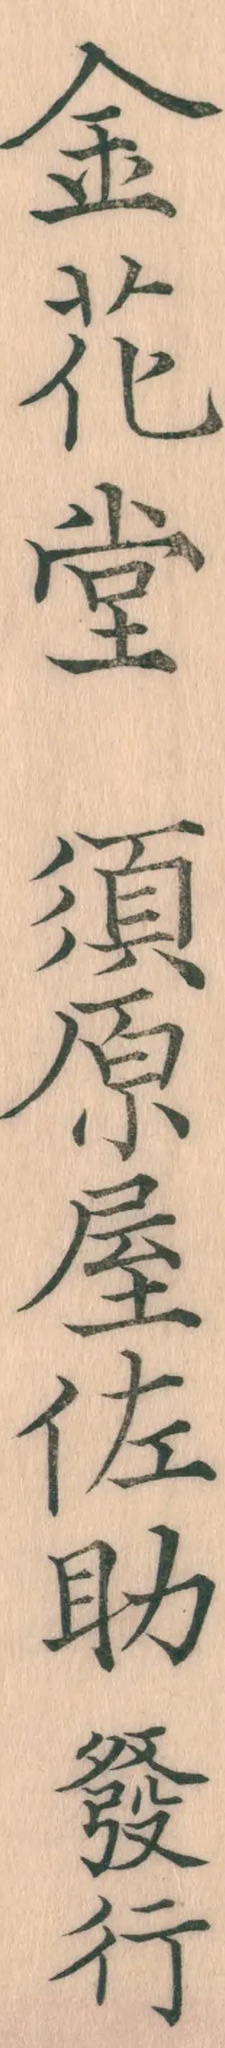金花堂須原屋佐助発行
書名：皇和魚譜 2巻
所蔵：国立国会図書館 National Diet Library, JAPAN
